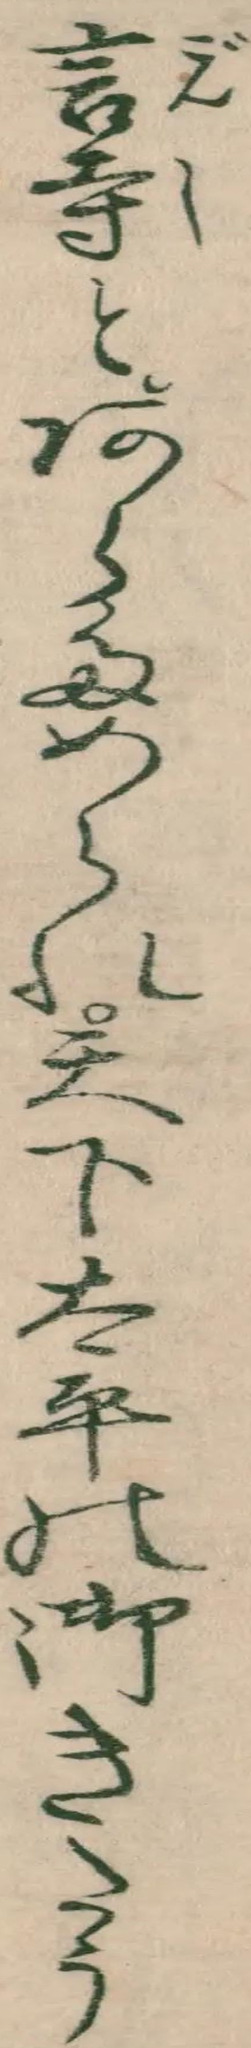言寺と。あらためられ。天下太平の御きたう
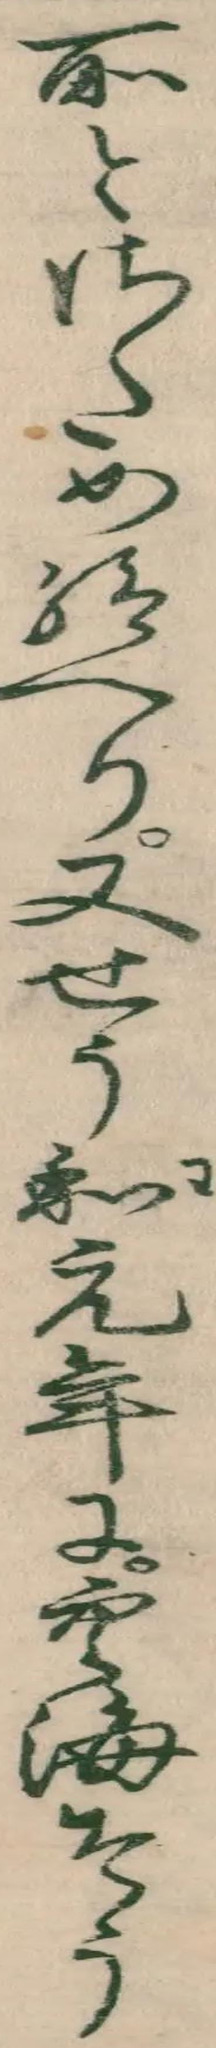所とさため給へり。又せう和元年に。空海そう
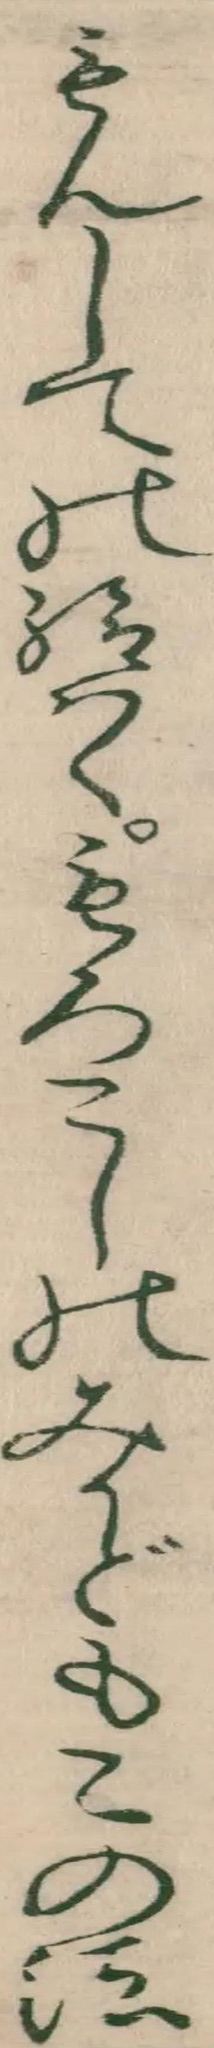もんしての給はく。もろこしのみかどもこの法
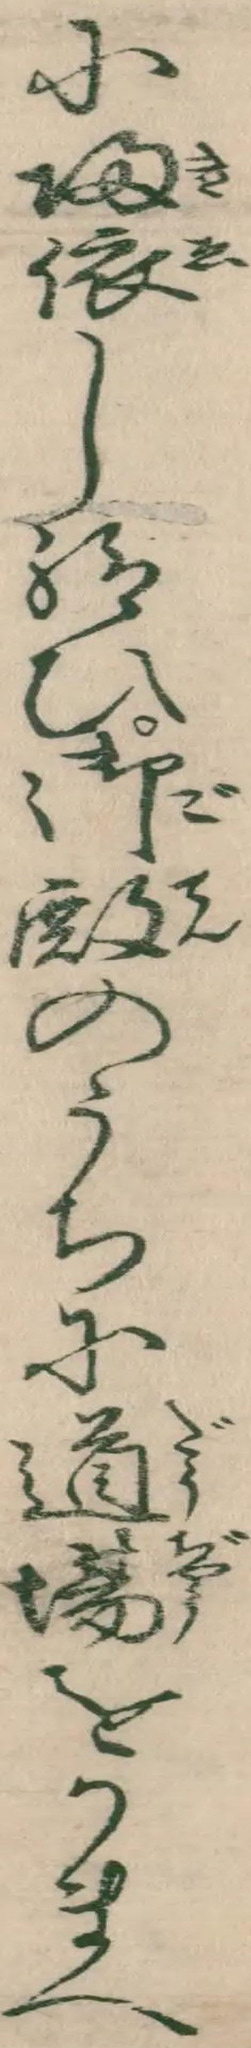に帰依し給ひ。御殿のうちに道場をかまへ
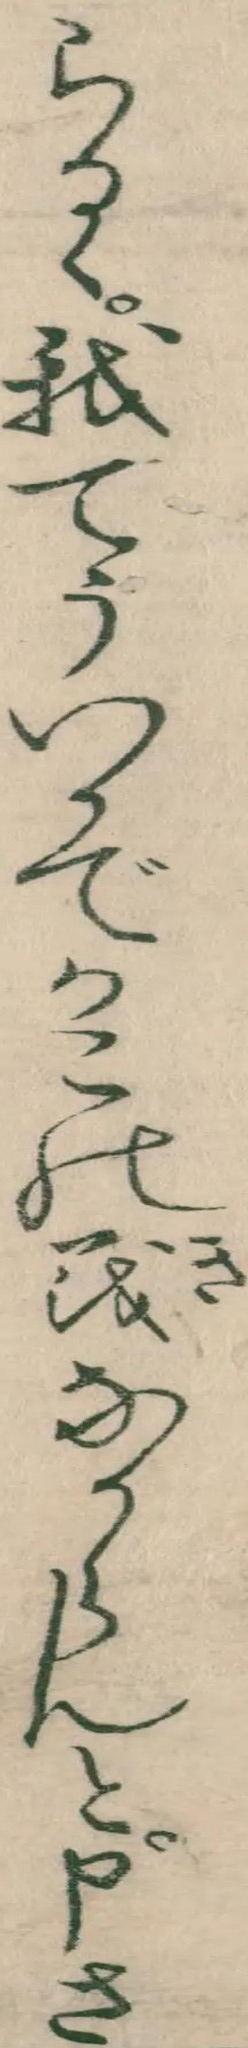らるゝ。我てういかでかこの義なからんと。申さ
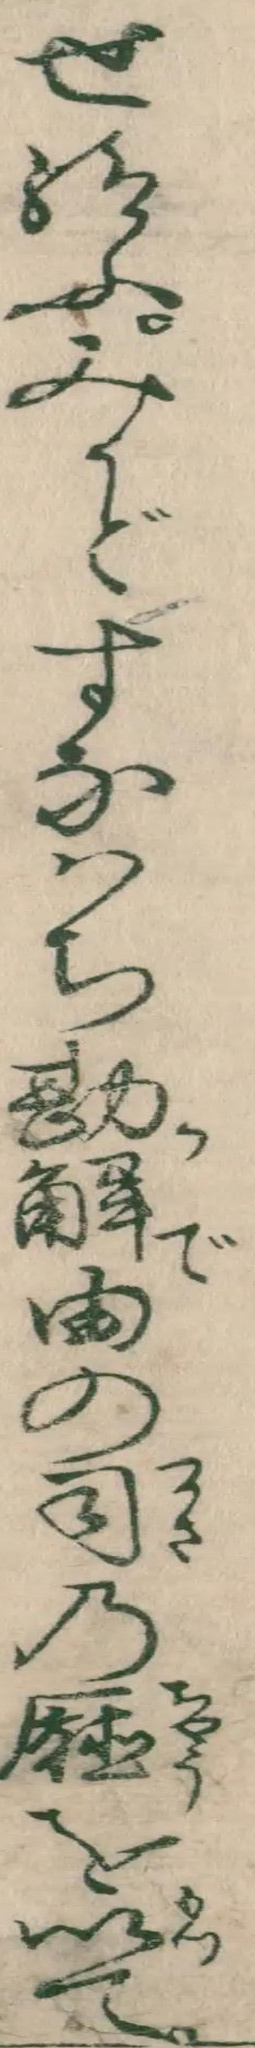せ給ふ。みかどすなはち勘解由の司の庁を以て。
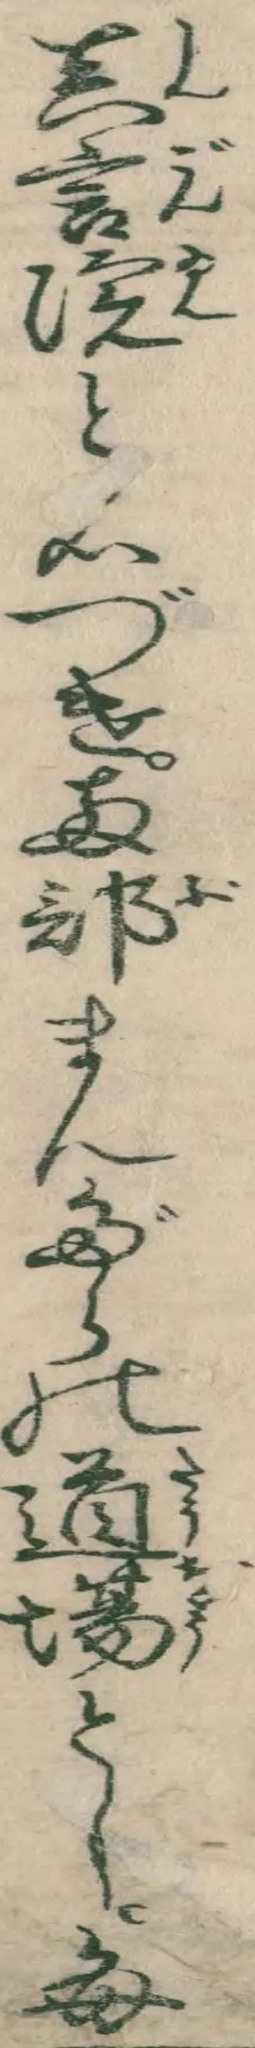真言院と名づけ。両部まんだらの道場とし。毎
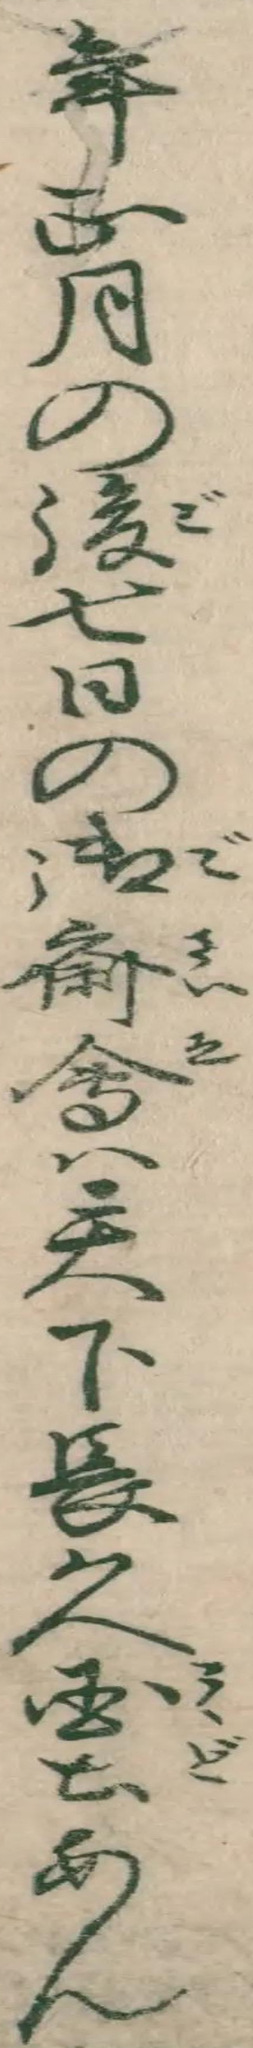年正月の後七日の御斎会は。天下長久国土あん
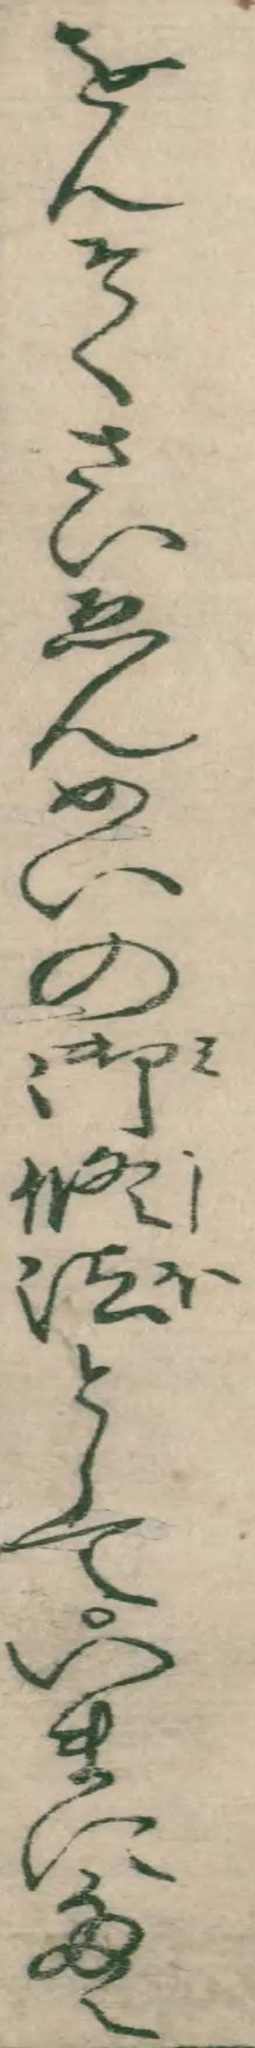をんそくさいゑんめいの御修法として。いまにたえ

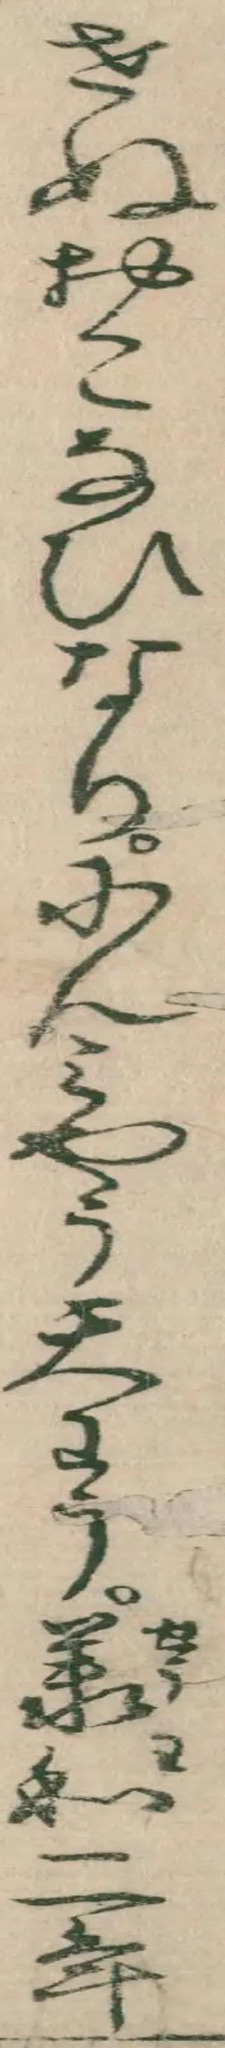さぬおこなひなり。にんみやう天わう承和二年
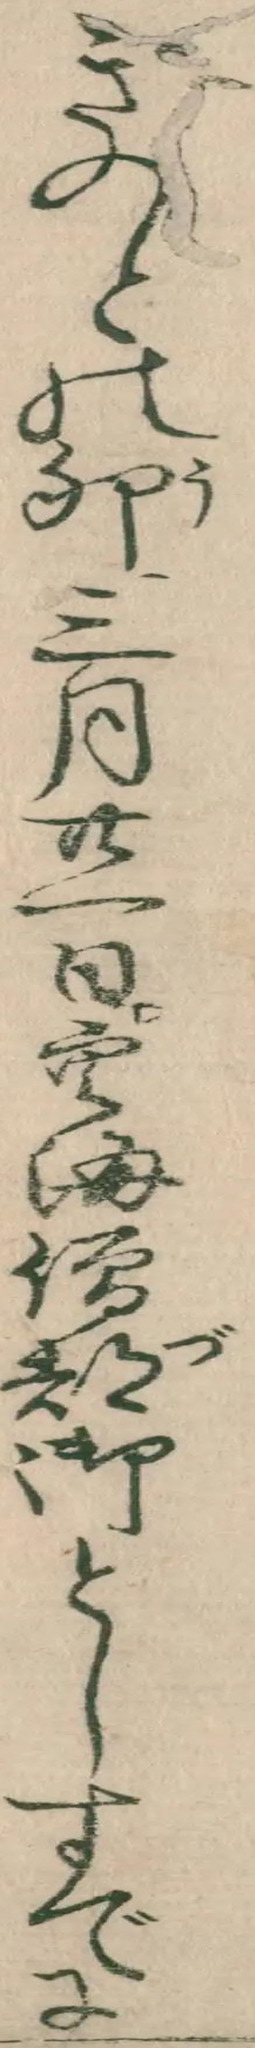きのとの卯三月廿一日。空海僧都御としすでに
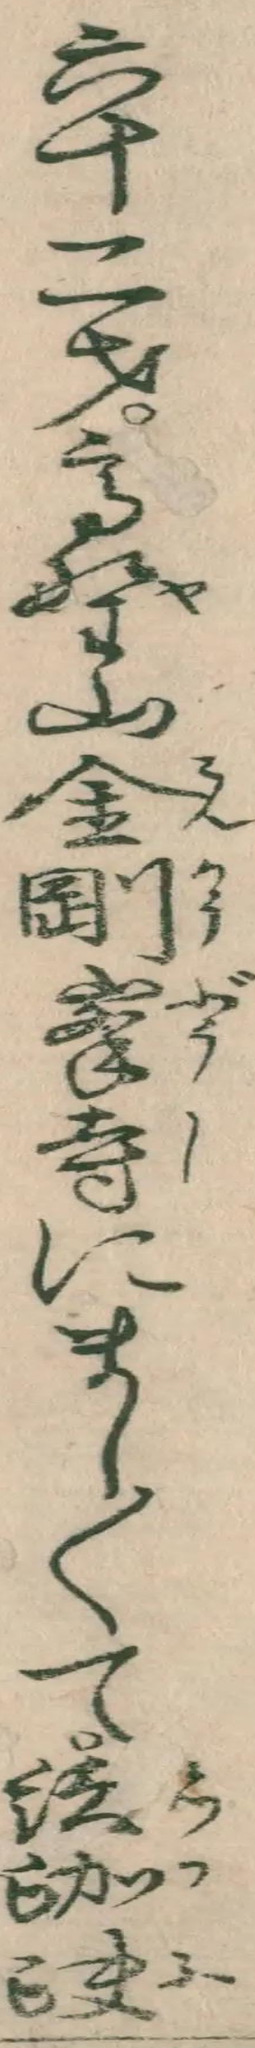六十二才。高野山金剛峯寺にまし〳〵て。結跏趺
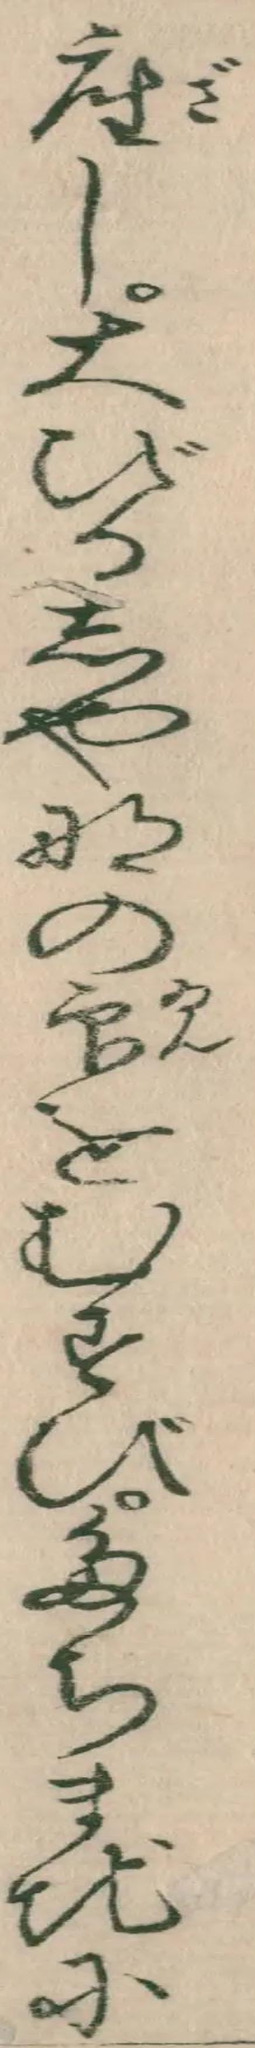座し。大びるしやなの印をむすび。たちまちに
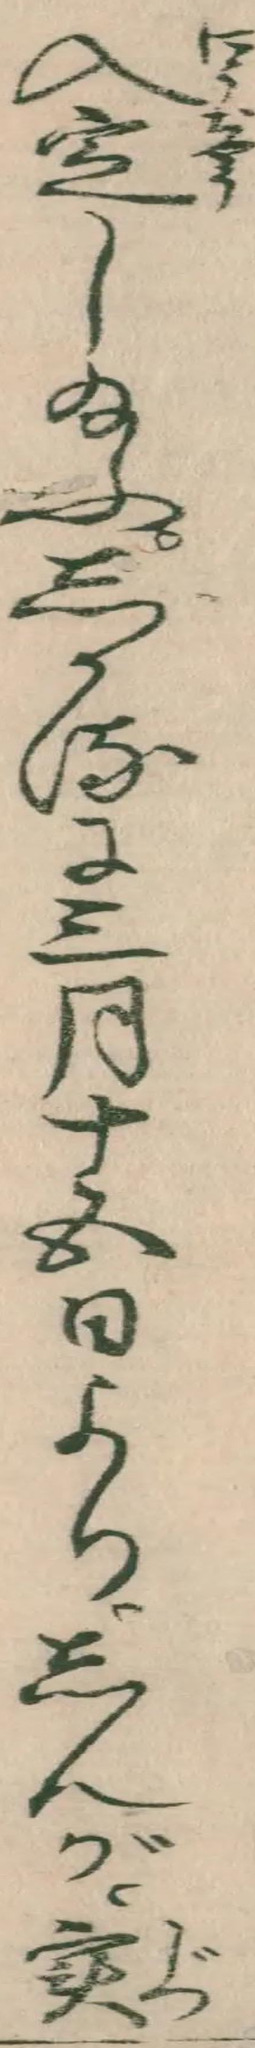入定し給ふ。しかるに三月十五日より。しんが。実
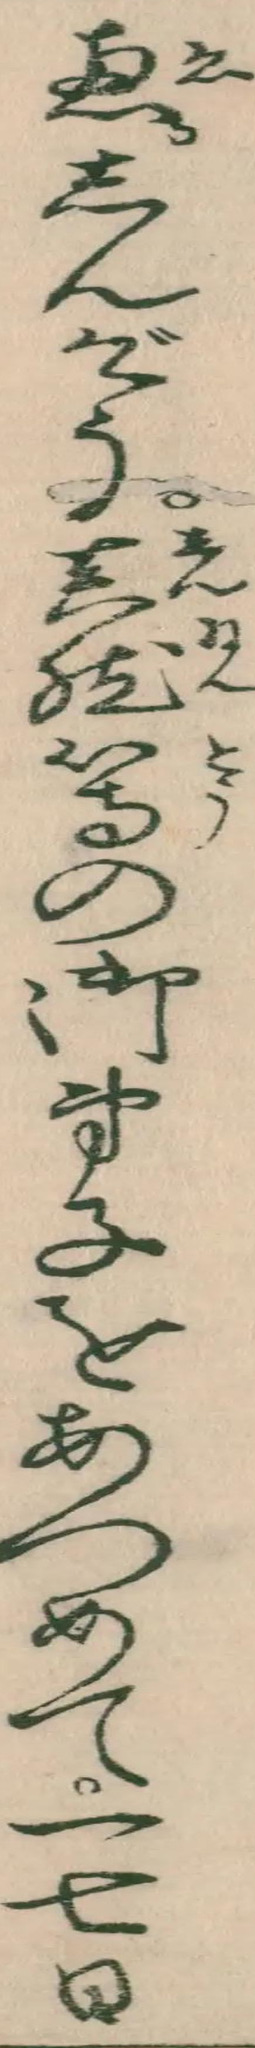恵しんげう。真然等の御弟子をあつめて。一七日
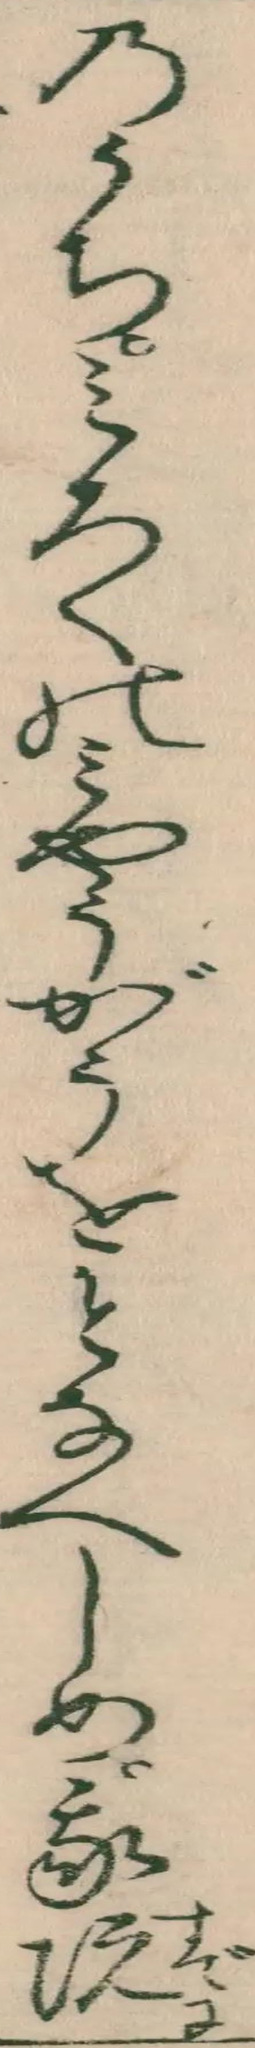のうち。みろくのみやうがうをとなへしめ。我既
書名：弘法大師御本地 3巻. [3]
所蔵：国立国会図書館 National Diet Library, JAPAN
